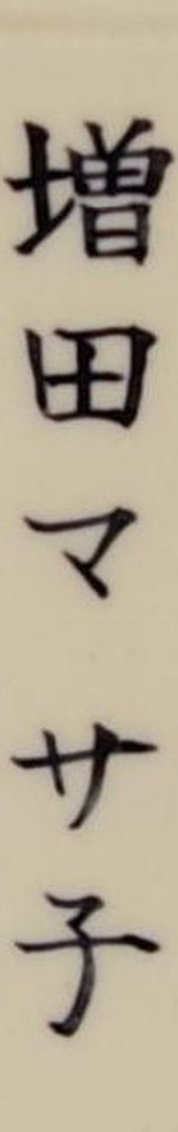増田マサ子
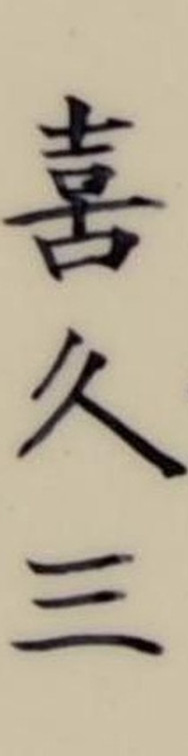喜久三
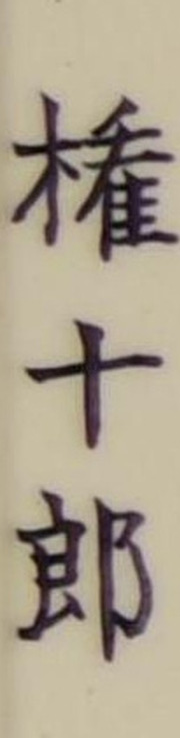権十郎

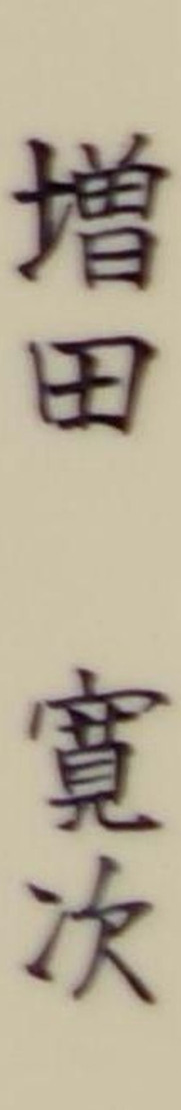増田寛次
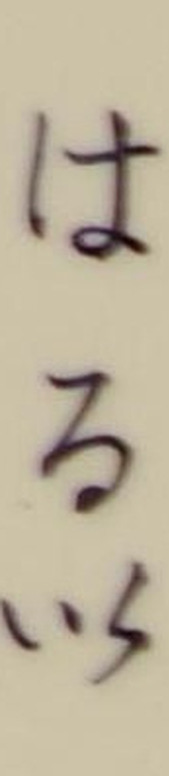はるい
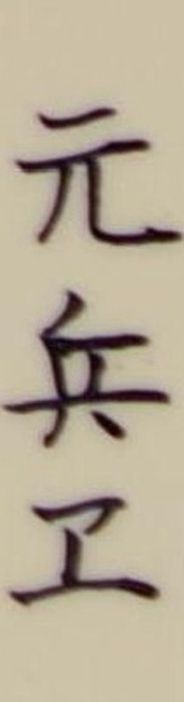元兵ヱ
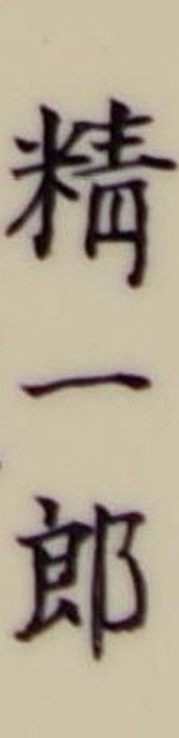精一郎
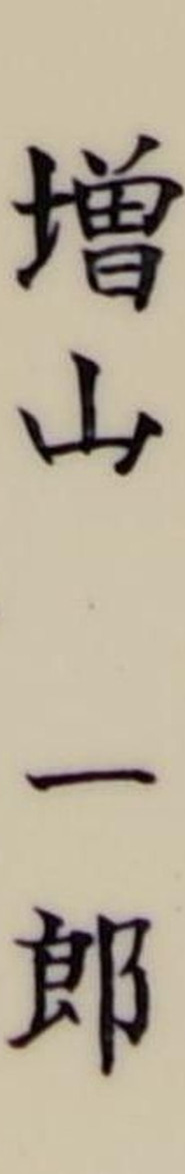増山一郎
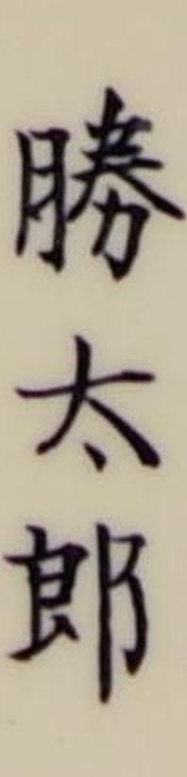勝太郎
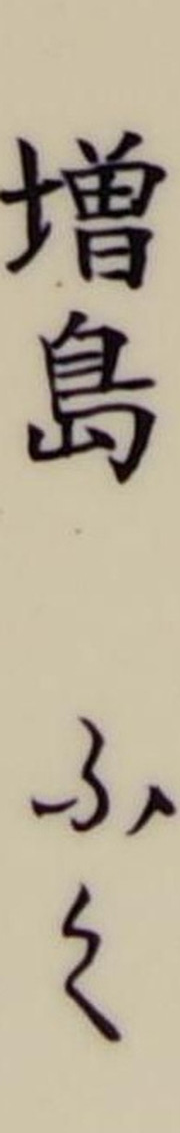増島ふく
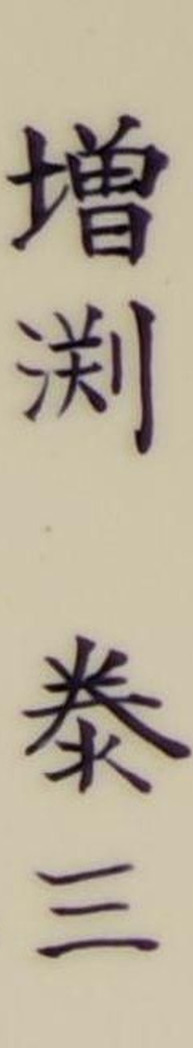増渕泰三
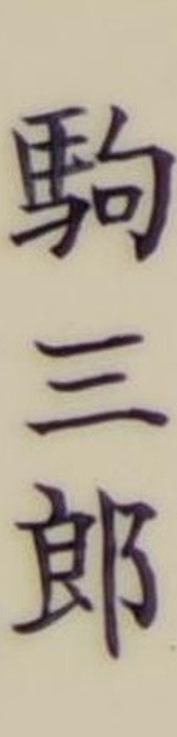駒三郎
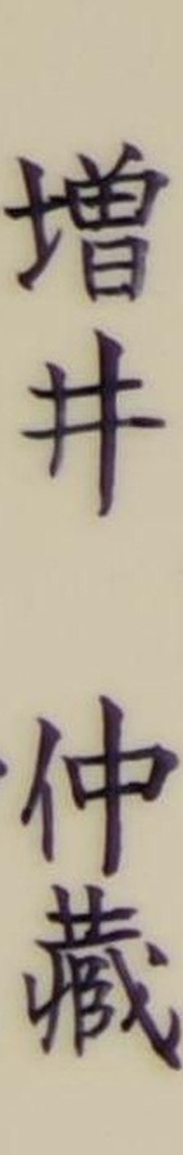増井仲蔵

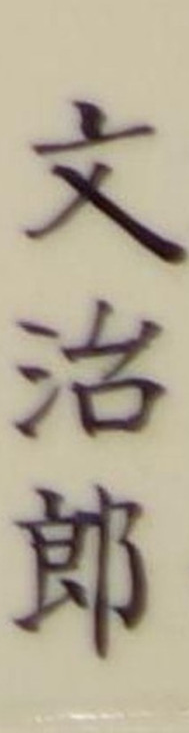文治郎
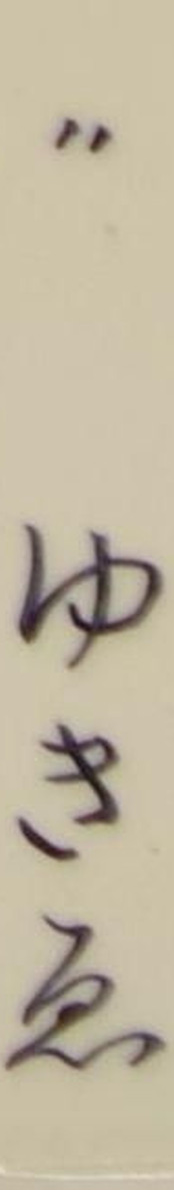ゆきゑ
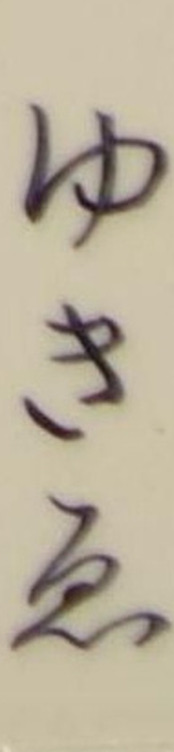ゆきゑ
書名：A~D
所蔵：koyasan kongobuji
